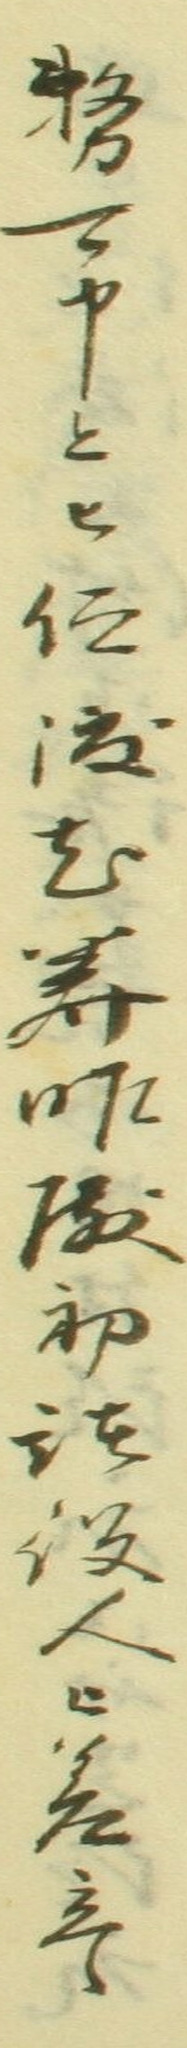務可申と被仰渡は華昨殿初諸役人被差立候

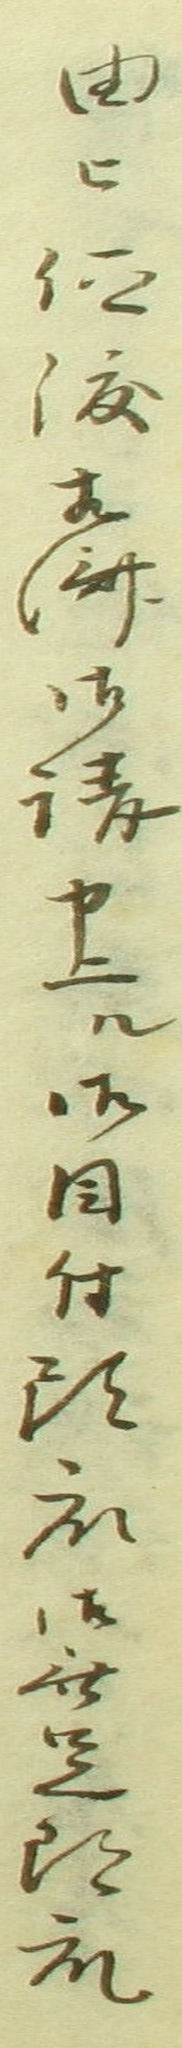由被仰渡相済御請申上ル御目付頭衆御無足頭衆
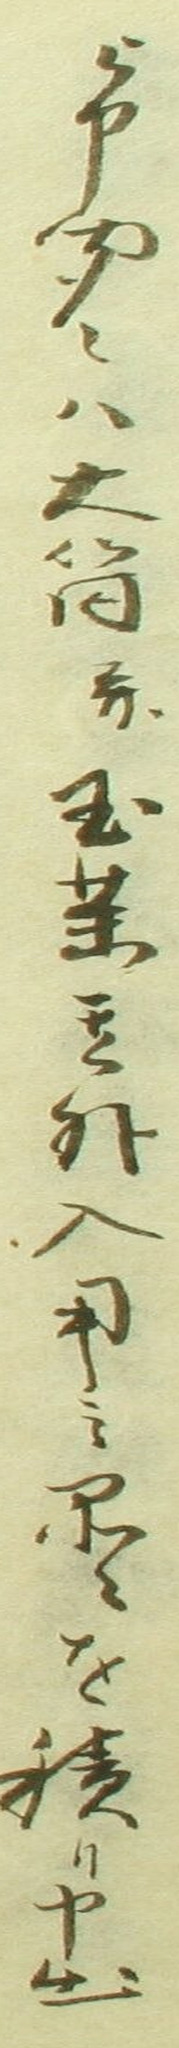被申聞候は大筒幷玉薬其外入用之品々を積り申出
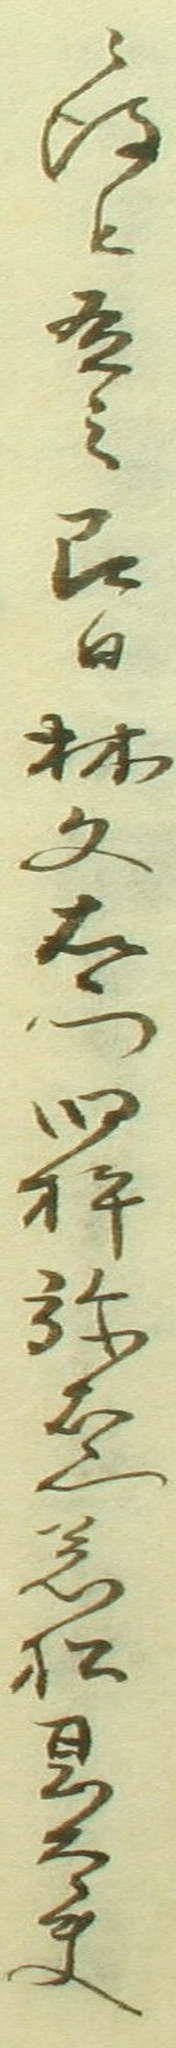候得と有之即日林文右衛門臼杵弥右衛門若松甚太夫
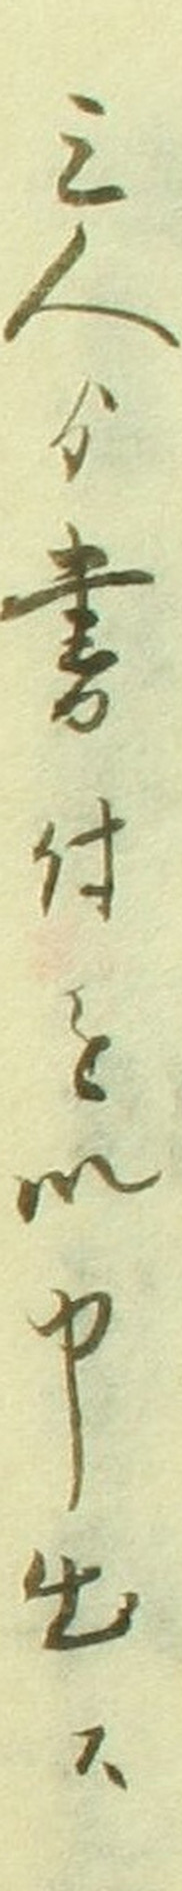三人ゟ書付を以申出ス
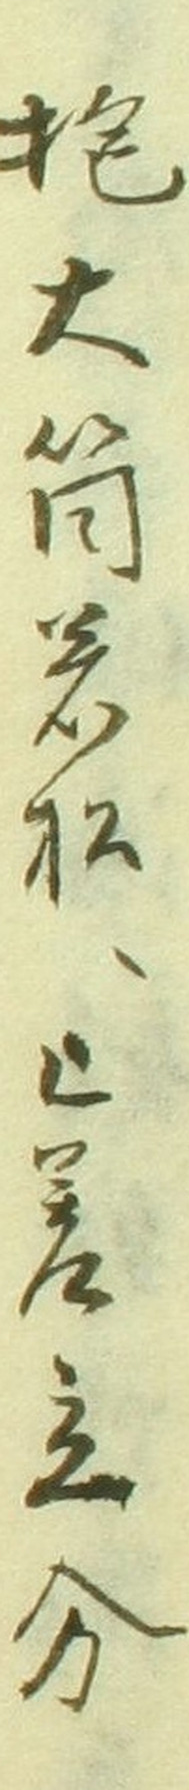抱大筒若松へ被差立分
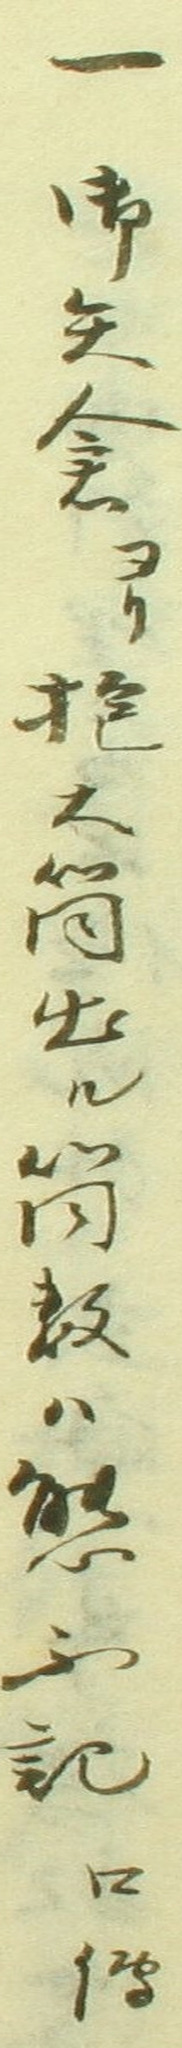一御矢倉ヨリ抱大筒出ル筒数は態不記口傳
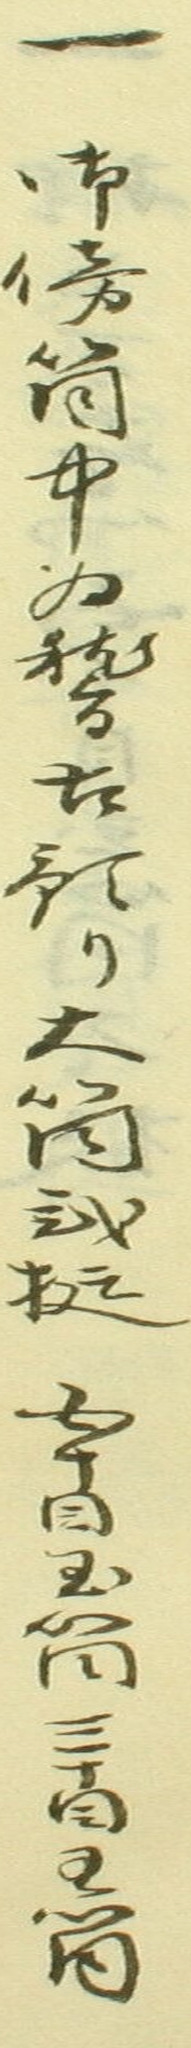一御傍筒中為稽古預り大筒弐挺五十目玉筒三十目玉筒
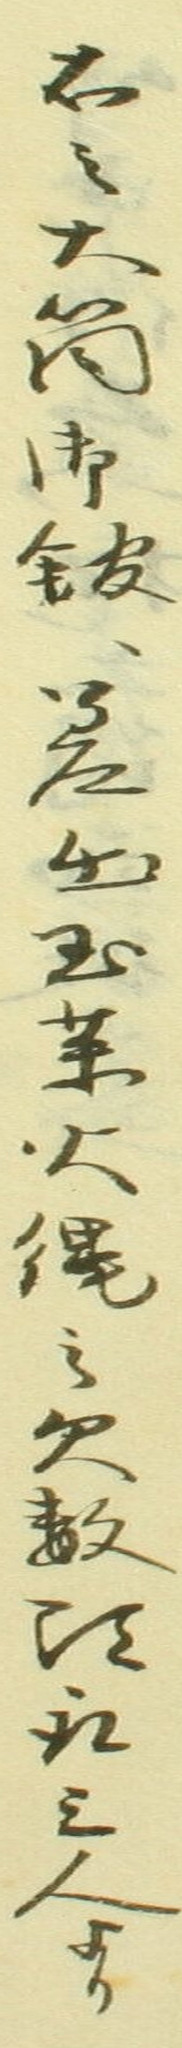右之大筒御館へ差出玉薬火縄之欠数頭取三人より
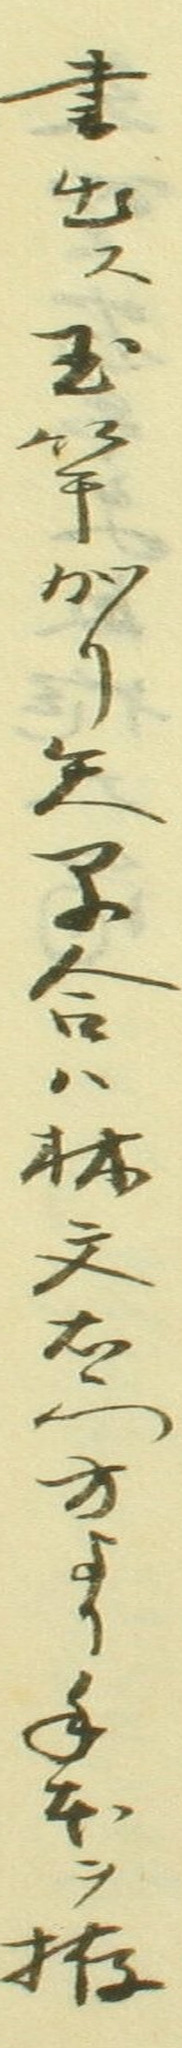書出ス玉竿がり矢早合は林文右衛門方より手本ヲ拵
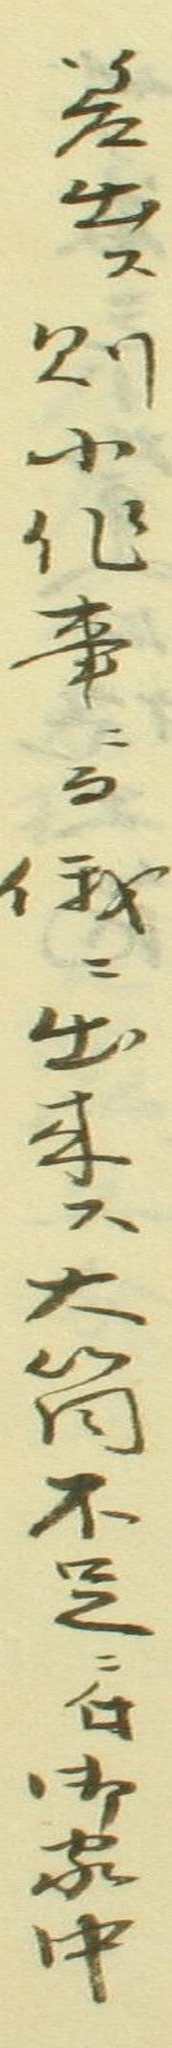差出ス則小作事ニ而俄ニ出来ス大筒不足ニ付御家中
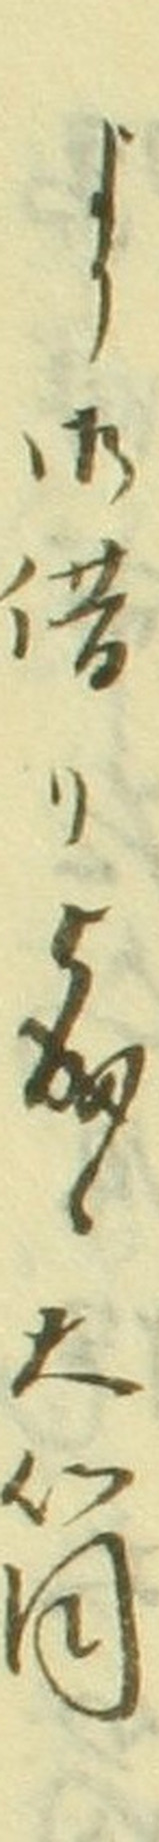より御借り被成候大筒
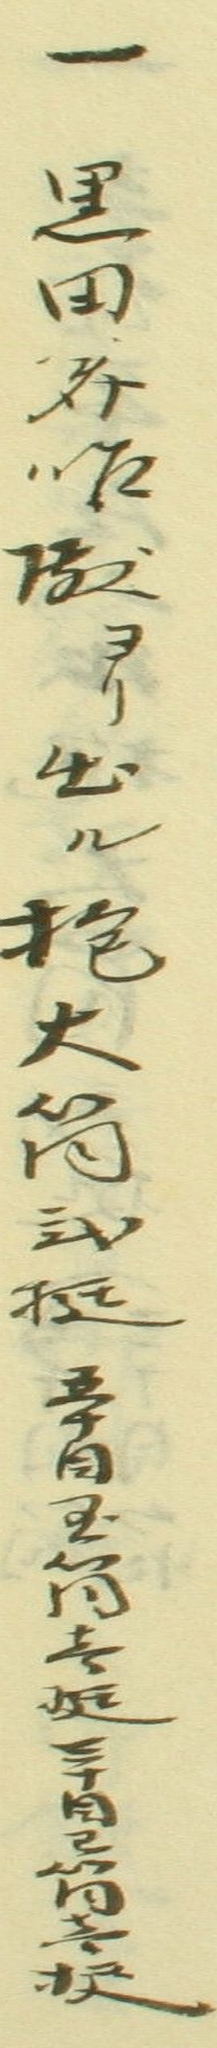一黒田介作殿ヨリ出ル抱大筒弐挺五十目玉筒壱挺三十目玉筒壱挺
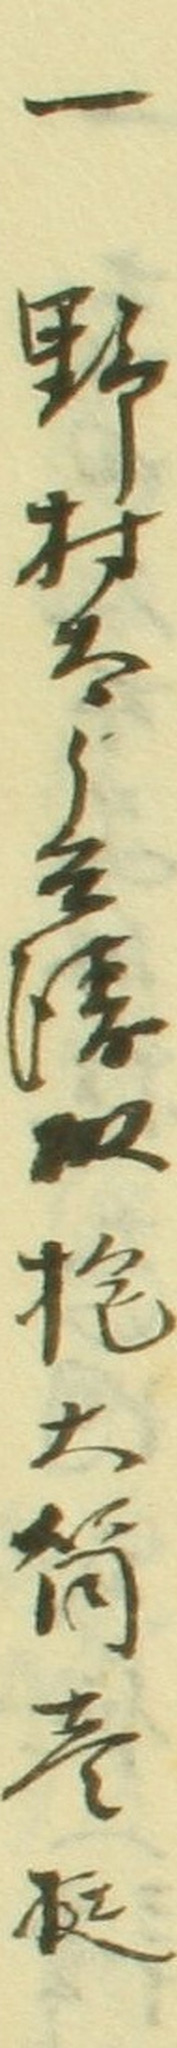一野村太郎兵衛殿抱大筒壱挺
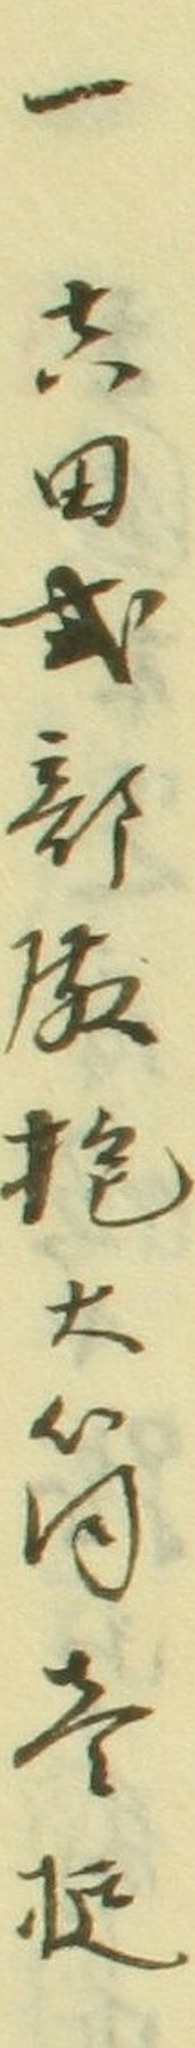一吉田式部殿抱大筒壱挺
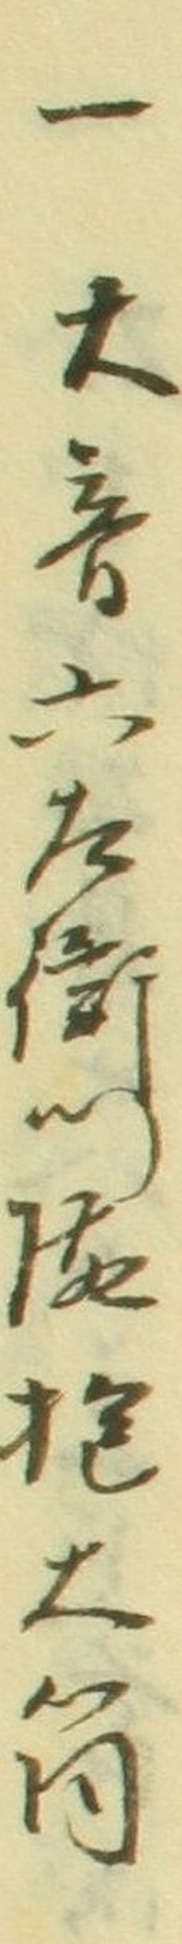一大音六左衛門殿抱大筒
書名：唐船漂流記 二
